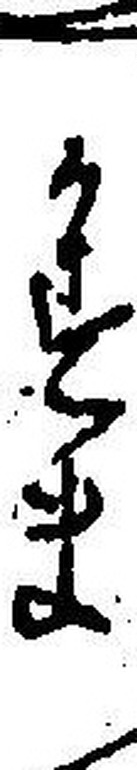かすま
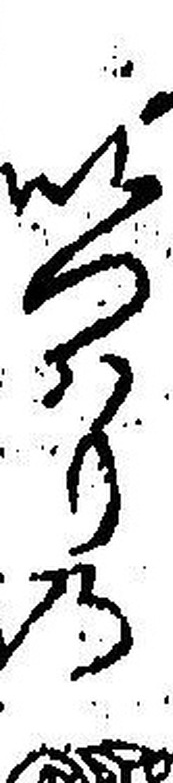いつはりの
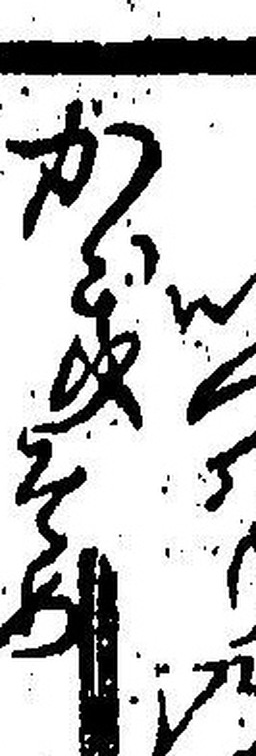かきそめ
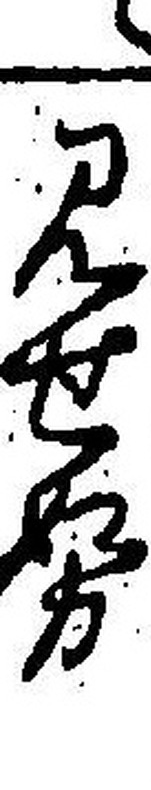見せぬ
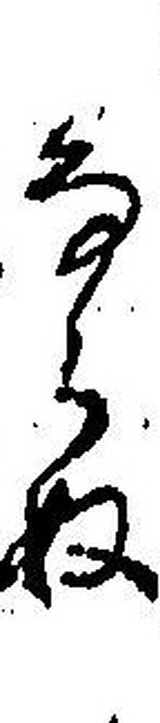ならぬ
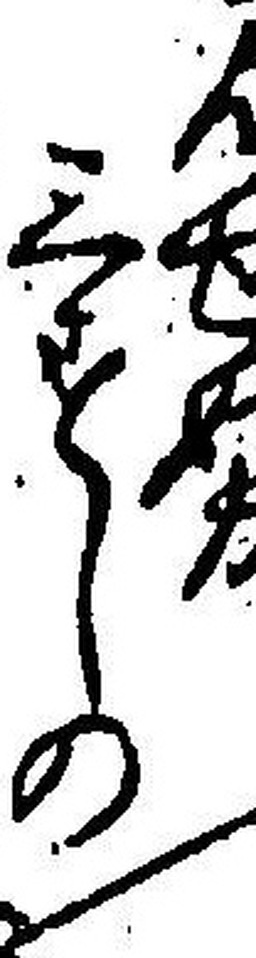みすしの
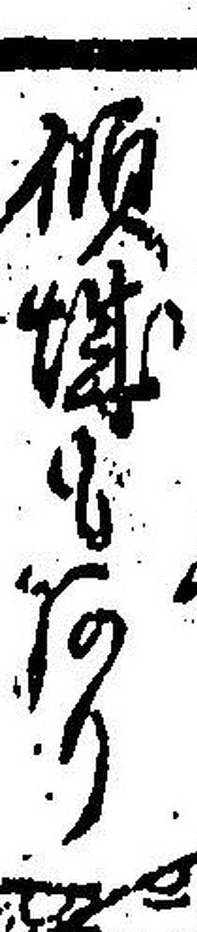傾城もあり
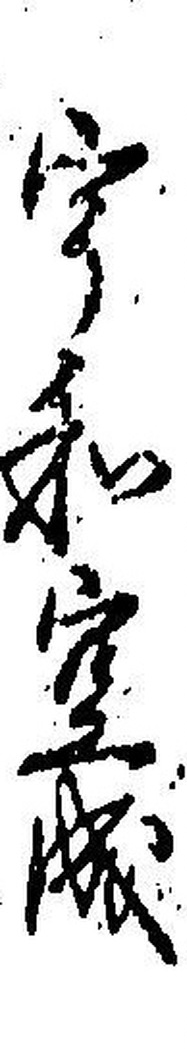宇和空成
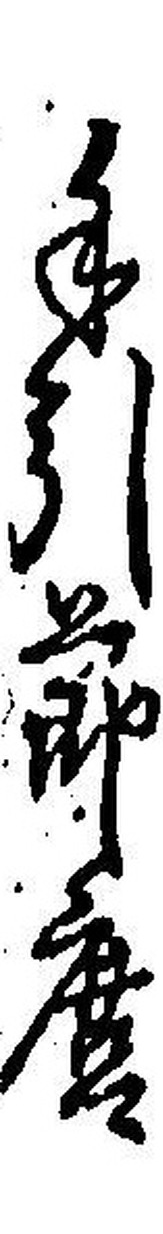手引節麿
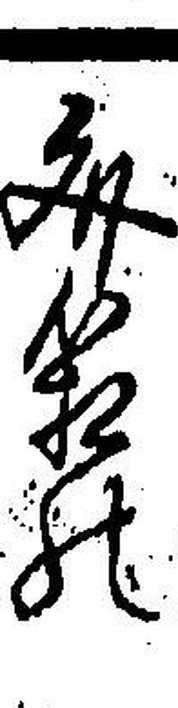文箱の
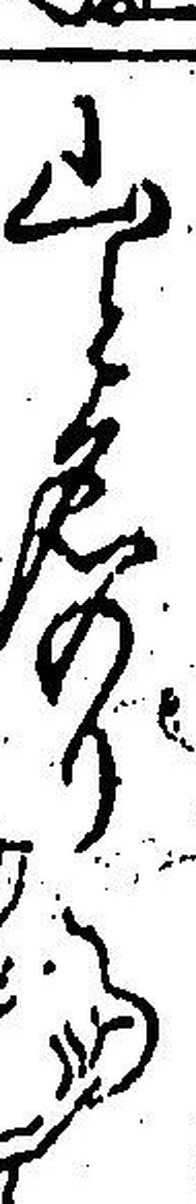山と名のり
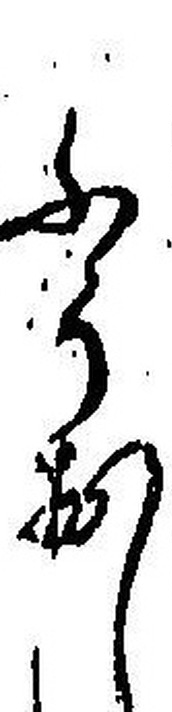ふうおし
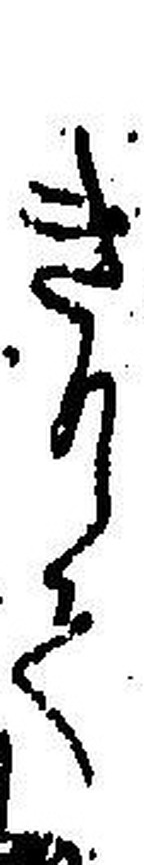きりて
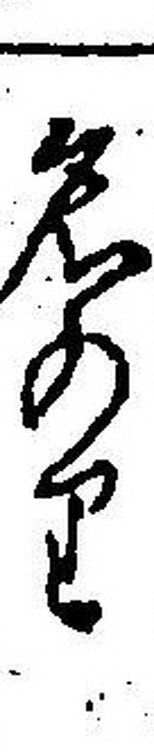名のり
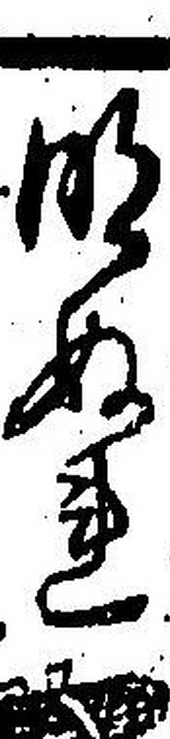明ぬれ
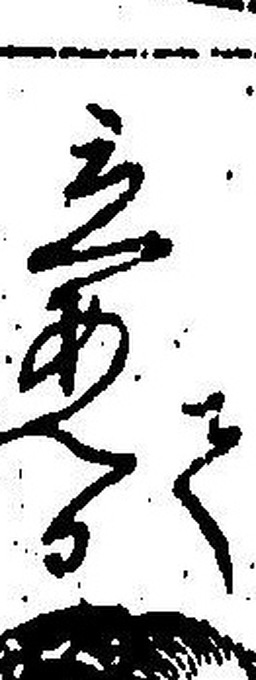立あへる
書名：どうれ百人一首 / 鹿都部真顔(狂歌堂)編
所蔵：東京大学総合図書館 General Library in the University of Tokyo, JAPAN
